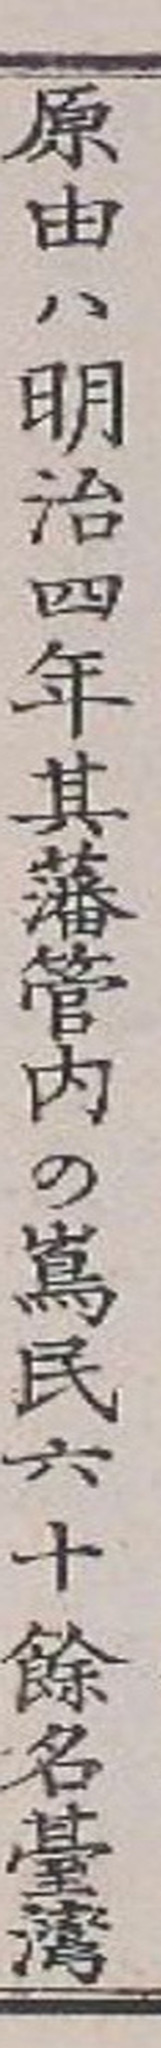原由は明治四年其藩管内の島民六十余名台湾
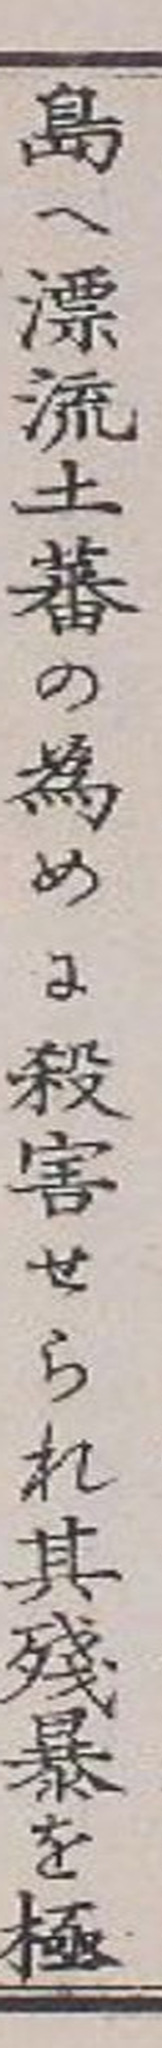島へ漂流土蕃の為めに殺害せられ其残暴を極
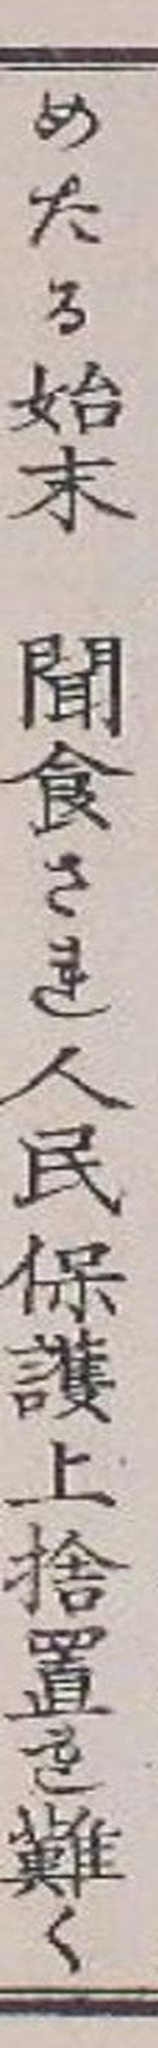めたる始末聞食され人民保護上捨置き難く
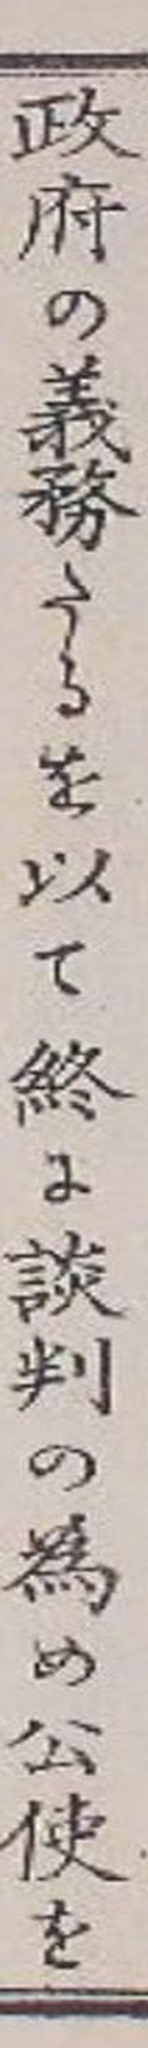政府の義務たるを以て終に談判の為め公使を
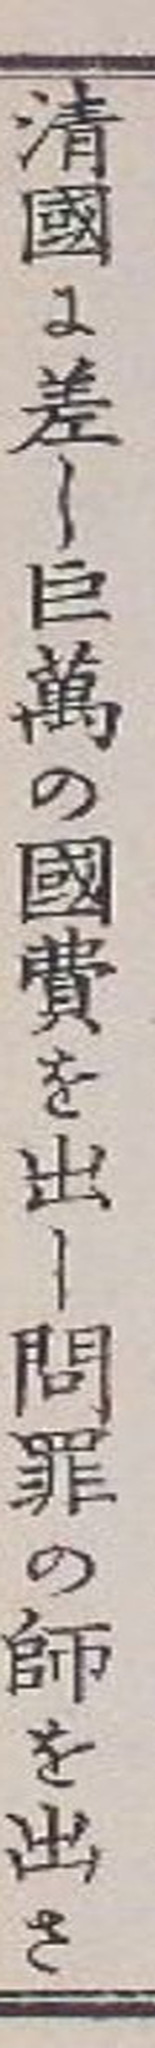清国に差し巨万の国費を出し問罪の師を出さ
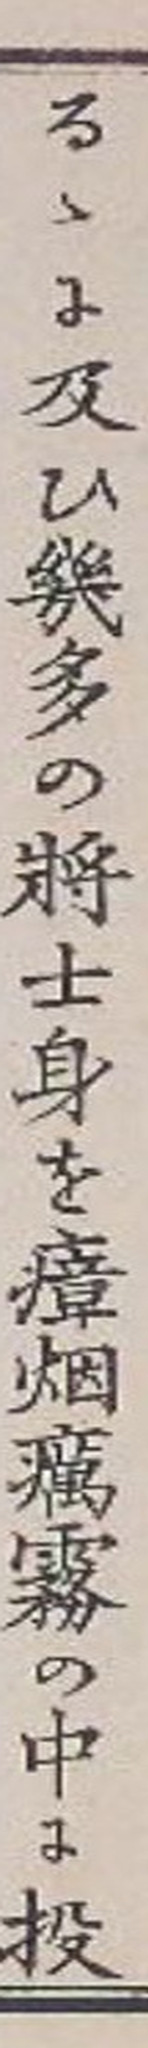るゝに及ひ幾多の将士身を瘴烟癘霧の中に投
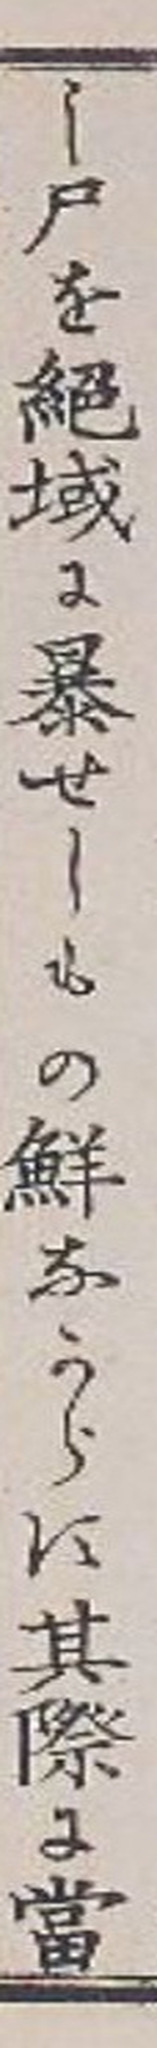し尸を絶域に暴せしもの鮮なからに其際に当
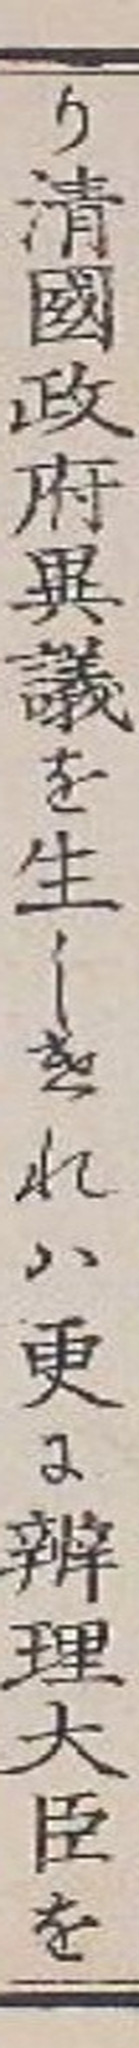り清国政府意義を生しけれは更に弁理大臣を
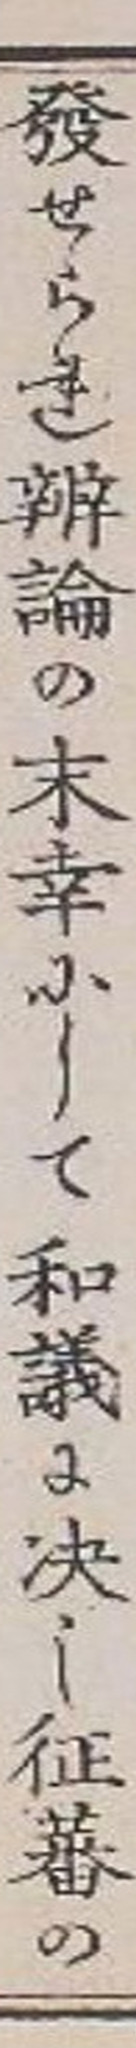発せられ弁論の末幸にして和議に決し征蕃の
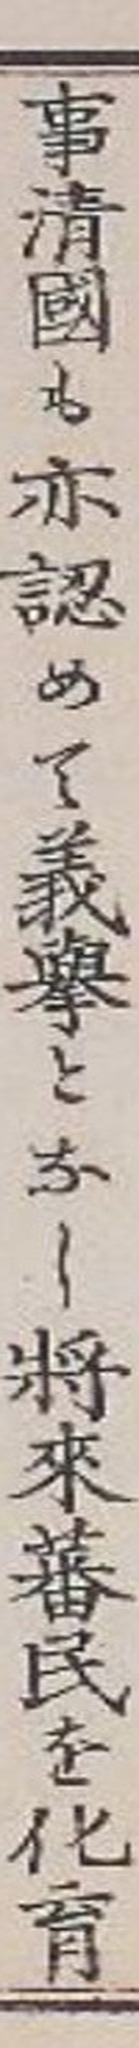事清国も亦認めて義挙となし将来蕃民を化育
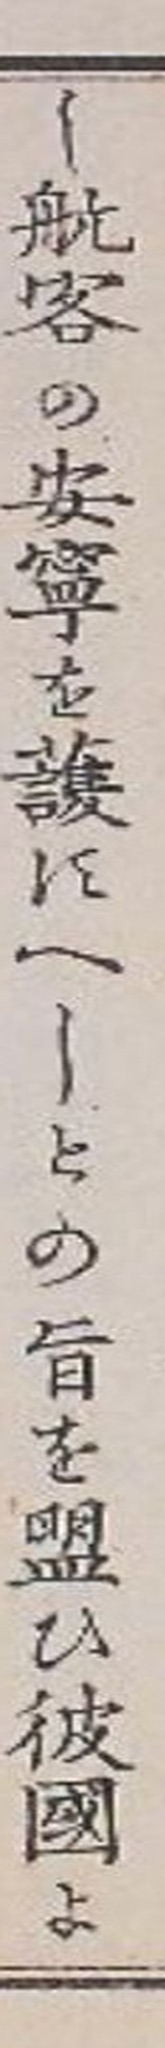し航客の安寧を護すへしとの旨を盟ひ彼国よ
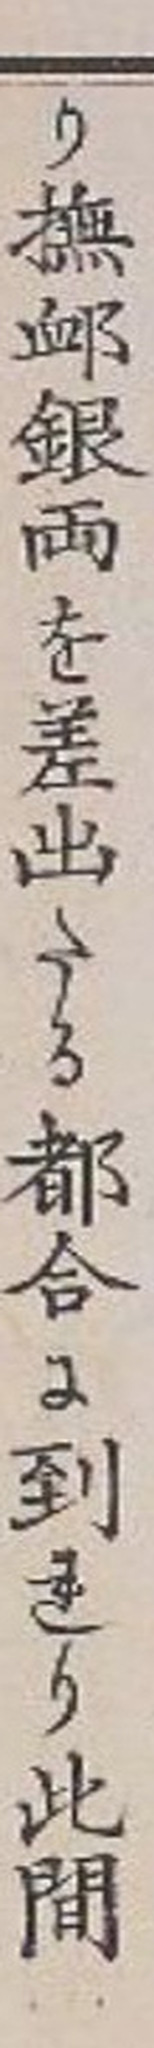り撫卹銀両を差出たる都合に到れり此間
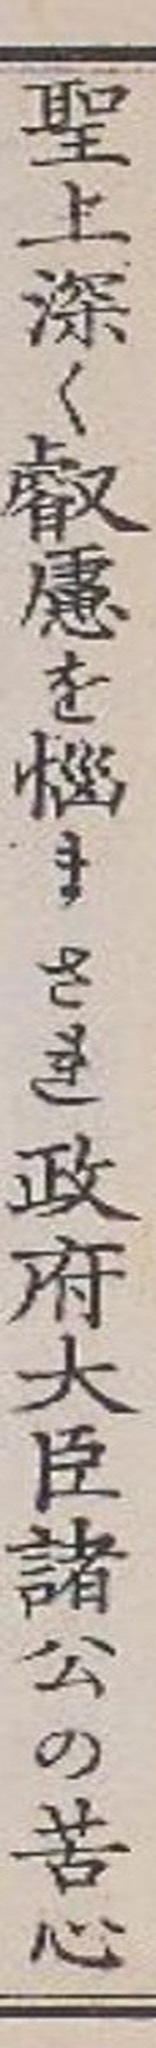聖上深く叡慮を悩まされ政府大臣諸公の苦心
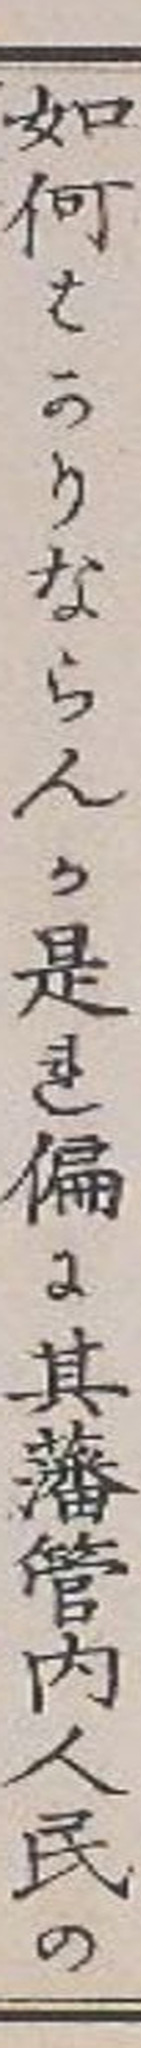如何はかりならんか是れ偏に其藩管内人民の
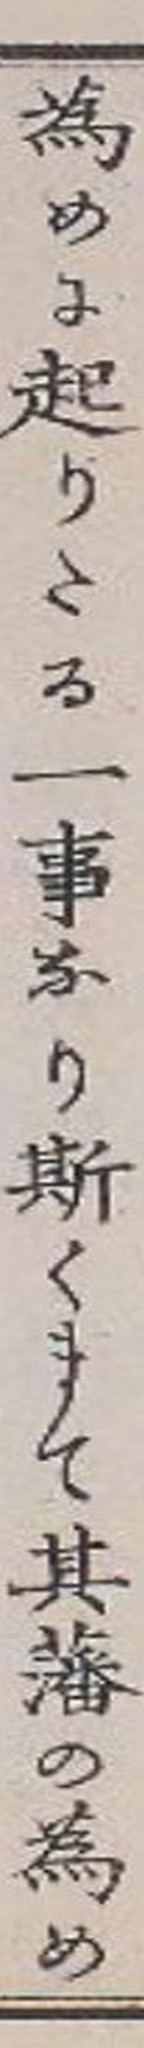為めに起りたる一事なり斯くまて其藩の為め
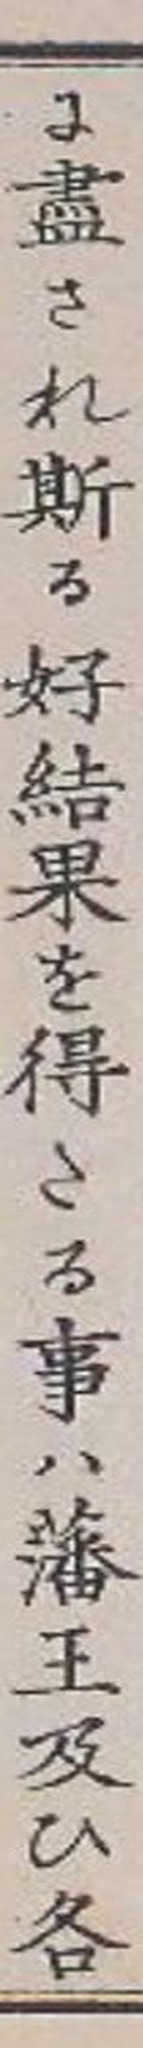に尽され斯る好結果を得たる事は藩王及ひ各
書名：南島紀事 下
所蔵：University of the Ryukyus Library
